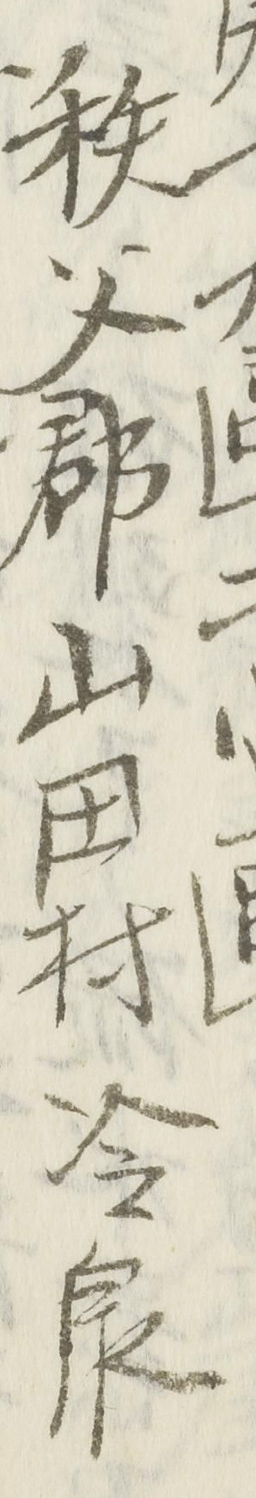秩父郡山田村冷泉
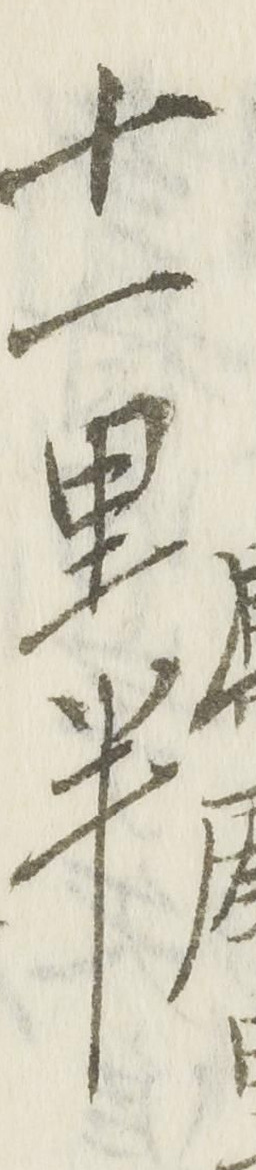十一里半
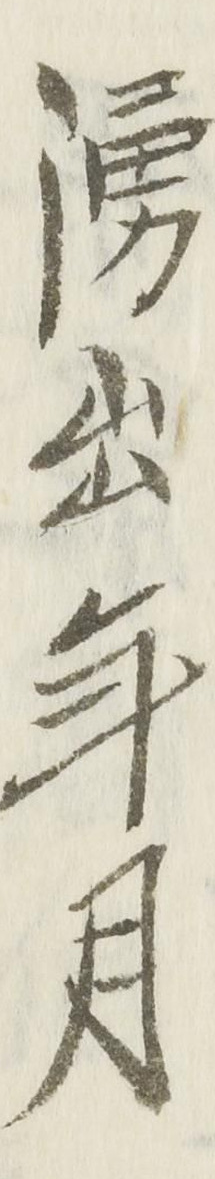湧出年月
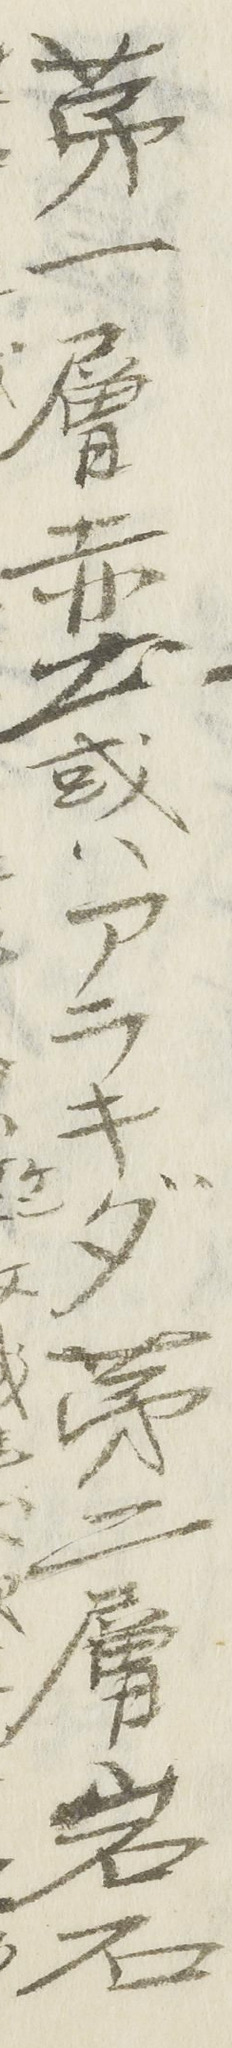第一層赤土或ハアラキダ第二層岩石
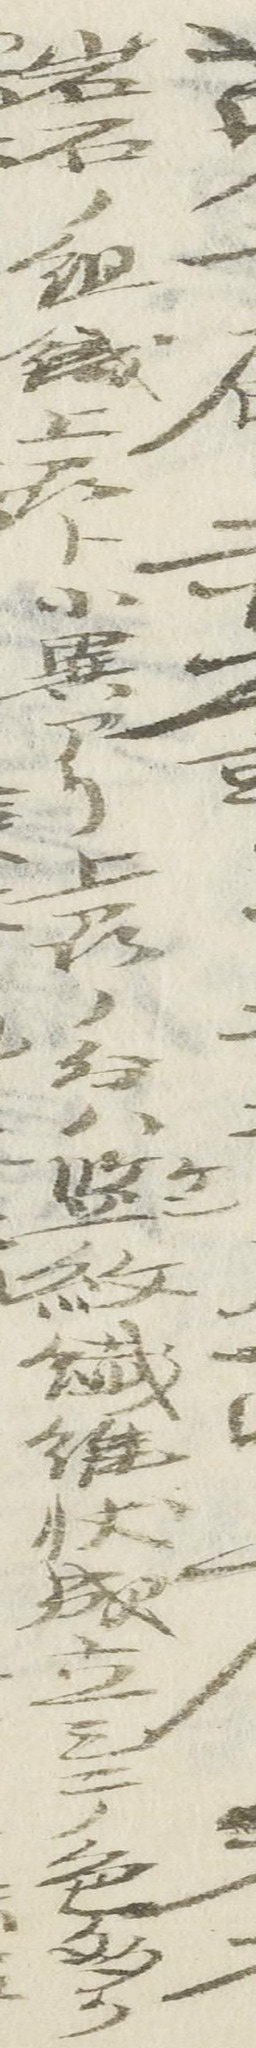岩石ノ組織上州ト小異アリ上州ノ分ハ監紋繊維状成立シテ色多ク
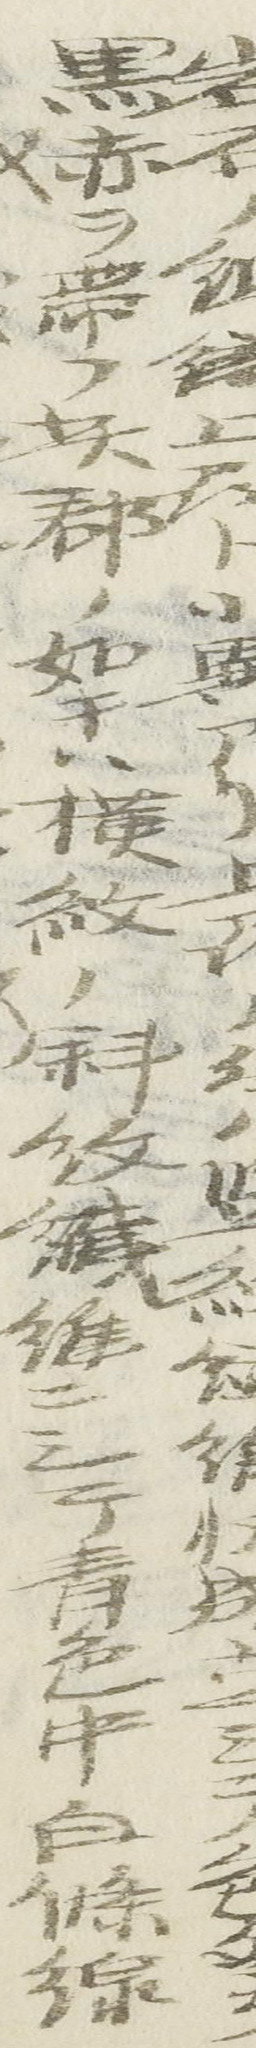黒赤ヲ帯フ此郡ノ如キハ横紋ノ斜紋繊維ニシテ青色中白條線
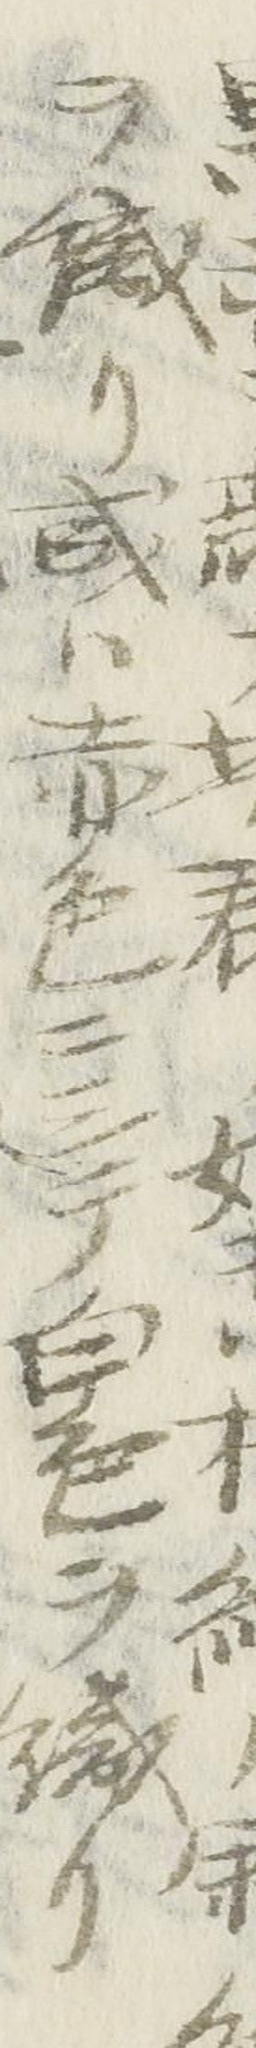ヲ織或ハ赤色ニシテ白色ヲ織リ
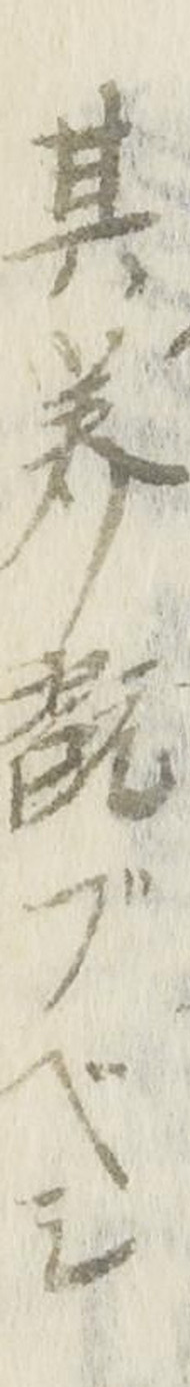美翫ブベシ

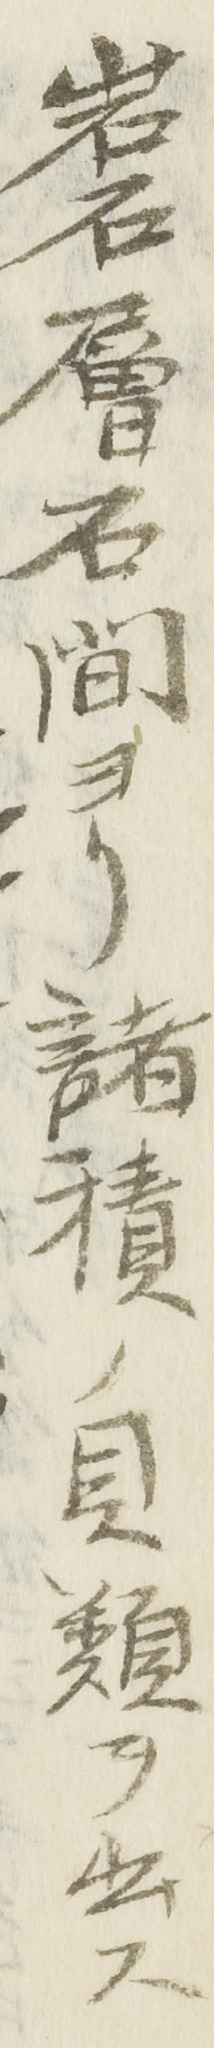岩層石間ヨリ諸積ノ貝類ヲ出ス
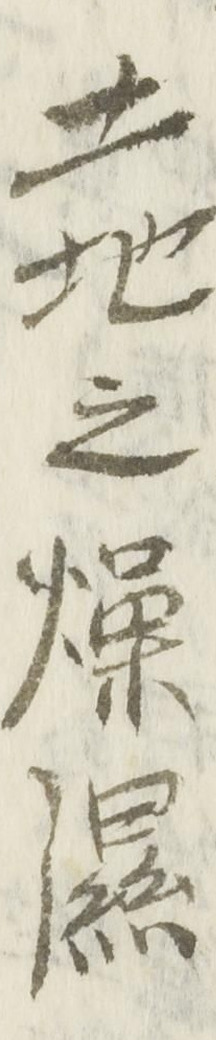土地之燥湿
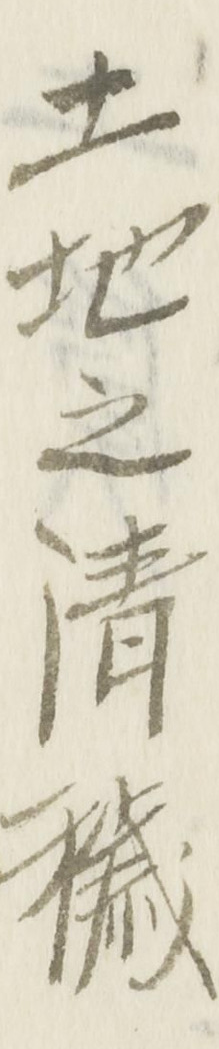土地之清穢
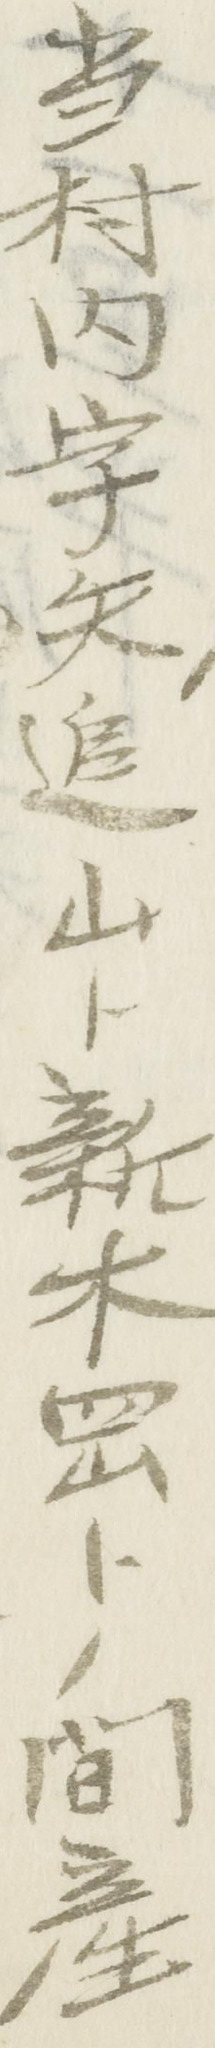当村内字矢追山ト新木岡トノ間産
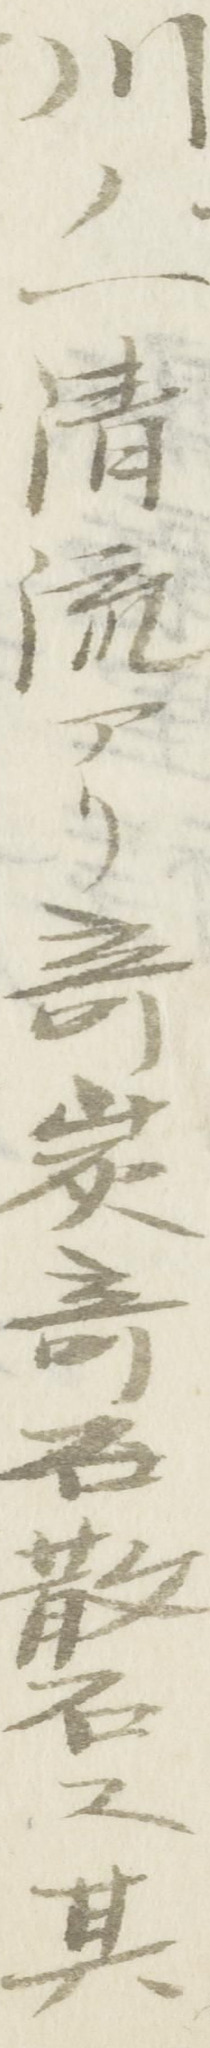川ノ一清流アリ奇炭奇石散石ス其
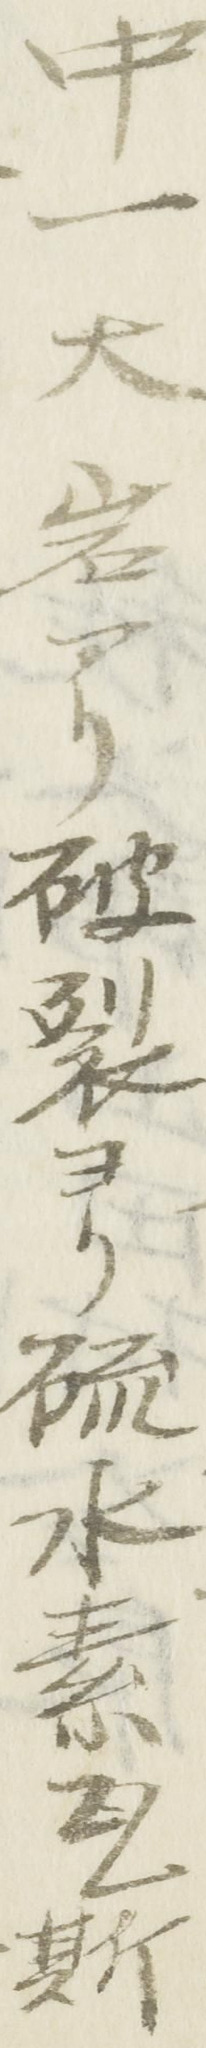中一大岩アリ破裂ヨリ硫水素瓦斯
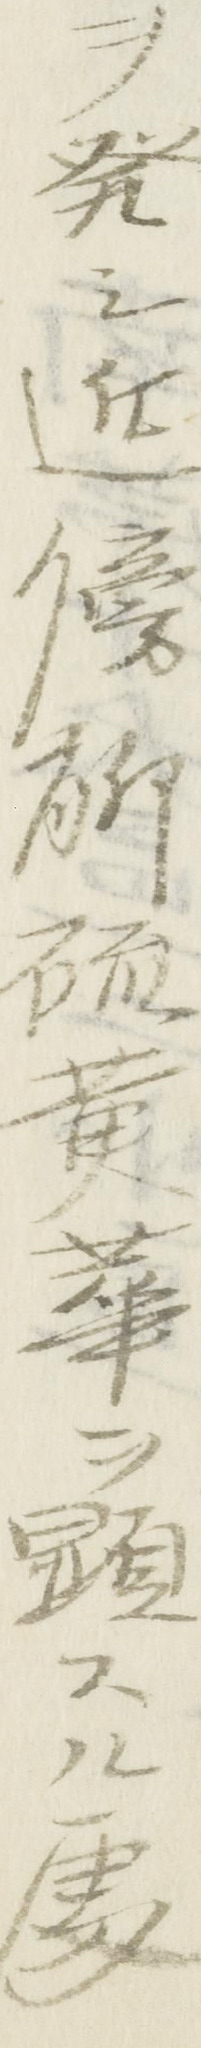ヲ発シ近傍聊硫黄華ヲ顕スル処
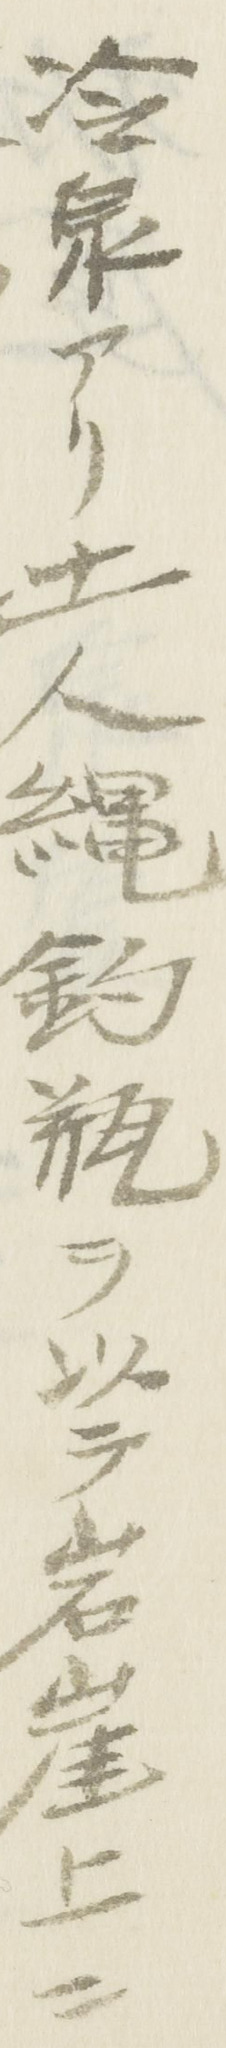冷泉アリ土人縄釣瓶ヲ以テ岩崖上ニ
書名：温冷泉試験表
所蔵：東京大学地震研究所図書室 Earthquake Research Institute Library, The University of Tokyo, JAPAN
